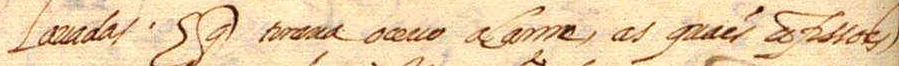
Lauadas. E q̄ tiraua o ceuo a Carne, as quaes̄ cōfissoẽs
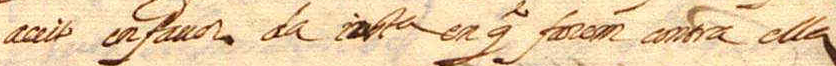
aceito en fauor da iusta en qto fazem contra ella
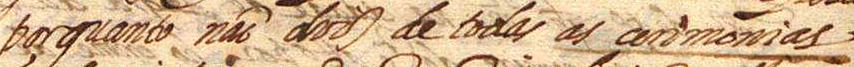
porquanto não diz̄ de todas as cerimonias
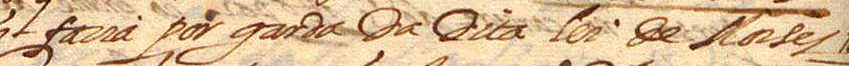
q̄ fazia por garda da dita lei de Moises
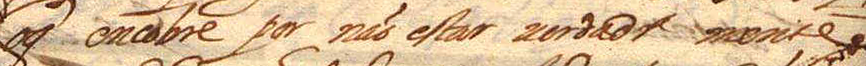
o q̄ encobre por naõ estar uerdadramente
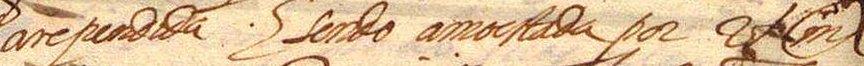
arependida. E sendo amoestada por Vs̄ ms̄
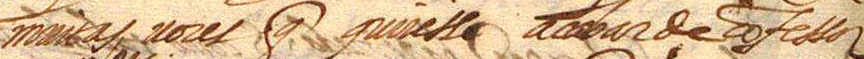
muitas uezes q̄ quizesse acabar de cōfessar
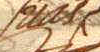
suas
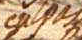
culpas
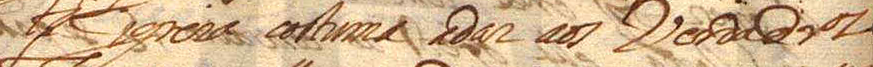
sta igreia costuma a dar aos Verdadroz
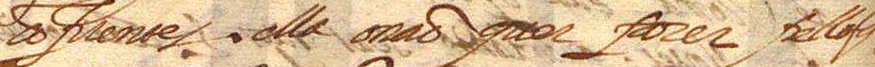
cōfitentes ella o naõ quer fazer pello q̄
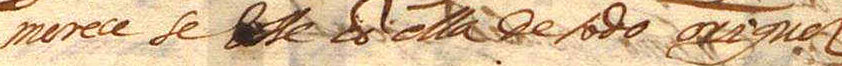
merece se Vsse cō ella de todo o riguor
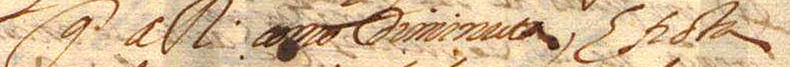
q̄ a R. como diminuta, E ficta
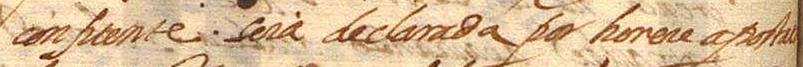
confitente seia declarada por hereie apostat
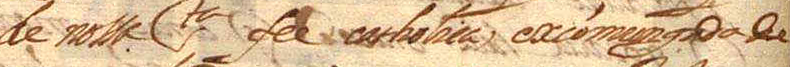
de nossa sta fee catholica, excōmungada de
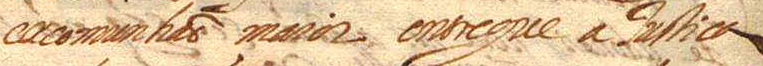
excomunhaõ maior entregue a Iustica
